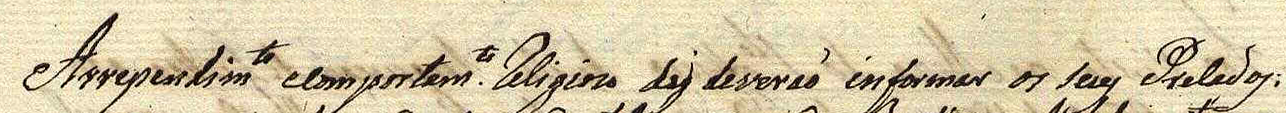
Arrependim.to e comportam.to Religiozo do q̄ deveraõ informar os seus Prelados:
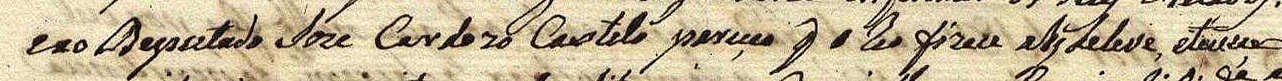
e ao Deputado Ioze Cardozo Castelo pareceo q̄ o Reo fizece abj de leve, e teuece
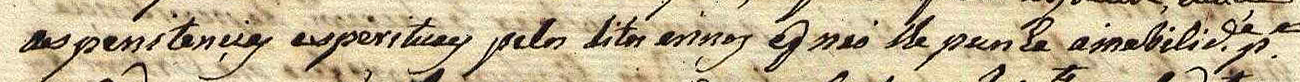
as penitencias esperituaes pelos ditos annos e q̄ naõ lhe punha a inabilid.e p.a
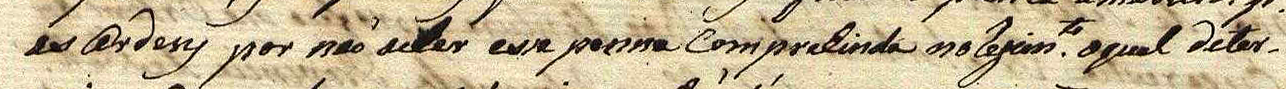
as Ordens por naõ achar esta penna comprehinda no Regim.to o qual deter
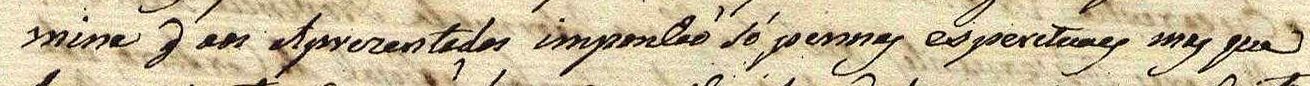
mina q̄ aos Aprezentados imponhaõ só pennas esperituaes mas que
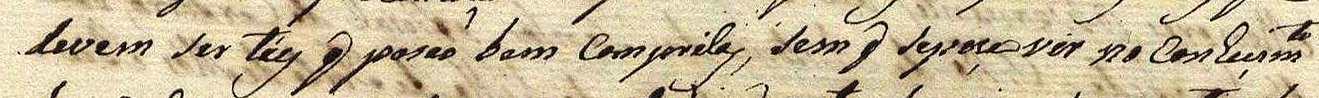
devem ser táes q̄ posão bem comprilas, sem q̄ se poça vir no conhecim.to
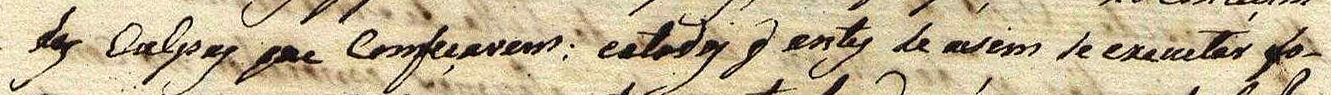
das Culpas que confeçarem: e a todos q̄ antes de assim se executar fo
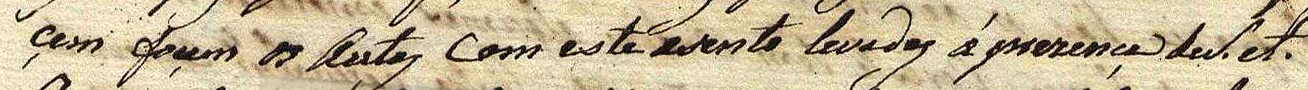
çem foçem os Autos com este asento levadas á prezença de S. A.
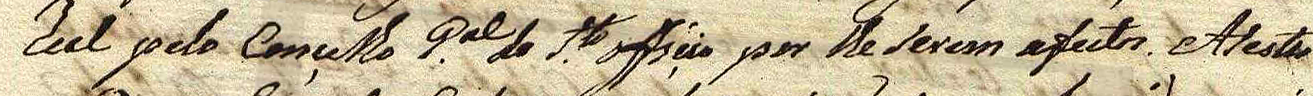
Real pelo Conçelho G.al do S.to officio por lhe serem afectos. Atestao
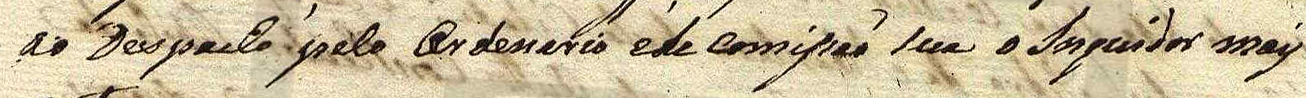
ao Despacho pelo Ordenario e de comissaõ sua o Inquidor mais
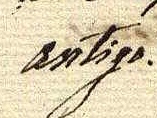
antigo.
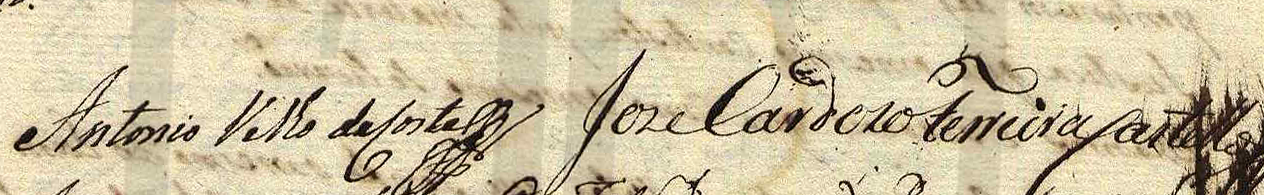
Antonio Velho da Costa Joze Cardozo Ferreira Castello
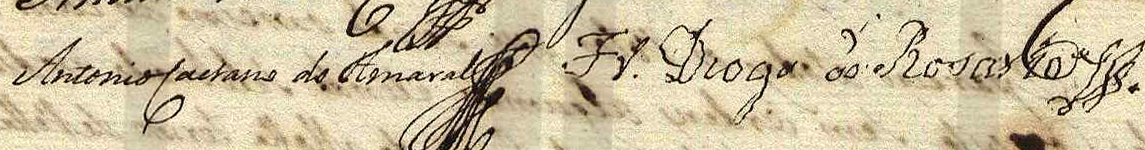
Antonio Caetano do Amaral Fr. Diogo do Rozario
